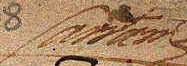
Sarram
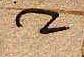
2
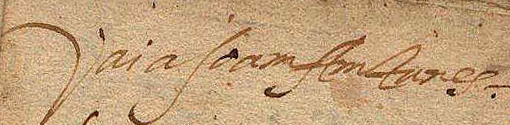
Vai a Joam Amtunes
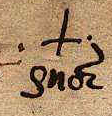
Snōr
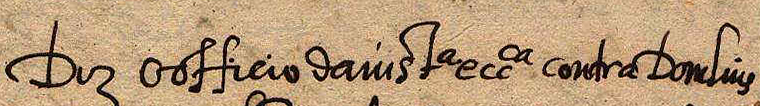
Diz o officio da iusta eccca contra Dom luis
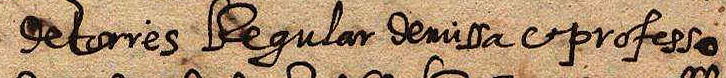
de torres Regular de missa e professo
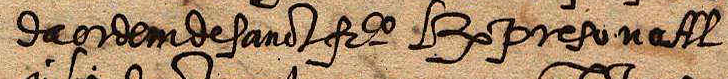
da ordem de sanct frco Rꝭ preso no Al
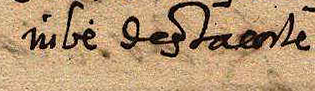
iube desta corte
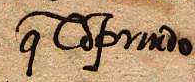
q̄ Cōprindo
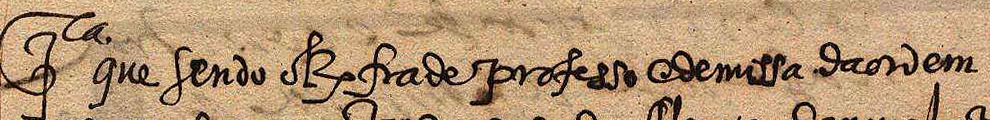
p̄ra que sendo o Rꝭ frade professo e de missa da ordem
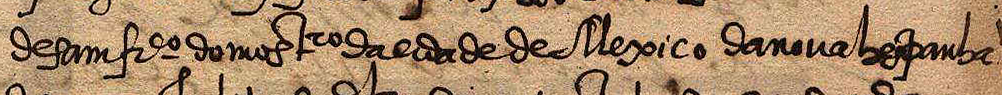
de sam frco do mostro da cidade de Mexico da noua hespanha
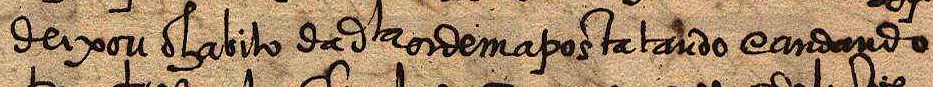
deixou o habito da dta ordem apostatando e andando
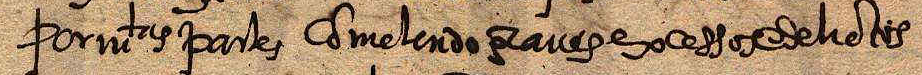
por mtas partes cōmetendo graues excessos e delictos
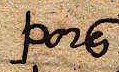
porq̄
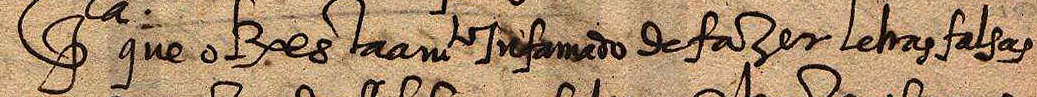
p̄ra que o Rꝭ estaa mto Infamado de fazer letras falsas
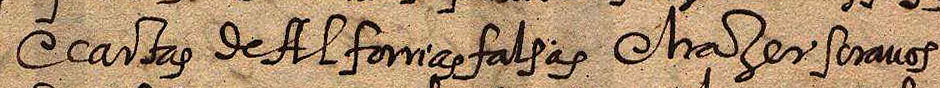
e cartas de Alforrias falsas e trazer scrauos
